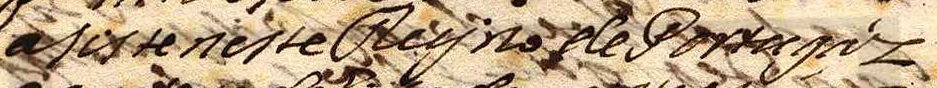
asiste neste Reyno de PortugaL
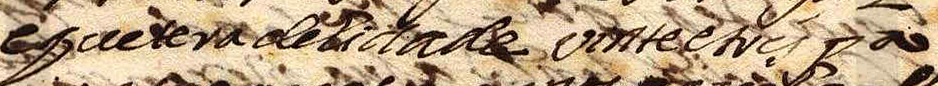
e que tera de hidade vinte e tres pa
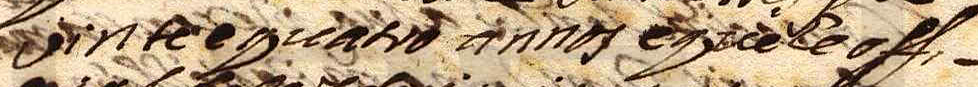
vinte e quatro annos e que he offi
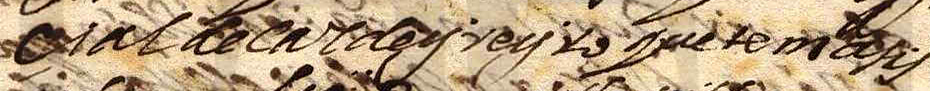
cial de caldeyreyro que tem asis
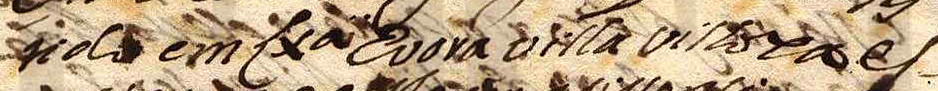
tido em Lx.a Evora villa vissoza e s
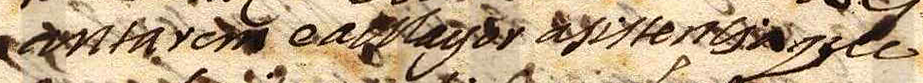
antarem e a Mayor asistencia que
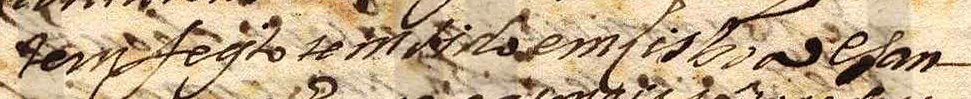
tem feyto tem sido em Lisboa e san
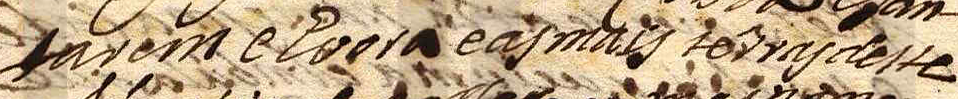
tarem e Evora e as mais terras deste
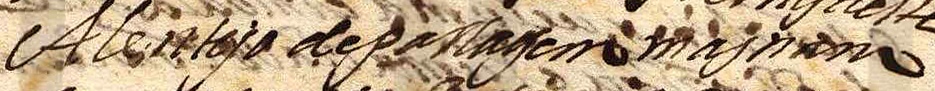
Alentejo de passagem mas nam
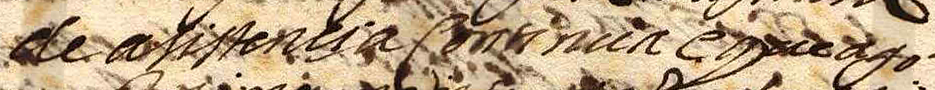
de asistencia Continua, e que ago
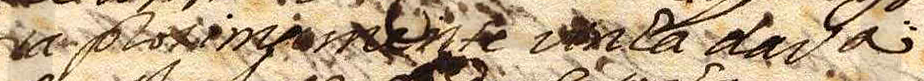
ra proximamente vinha da va
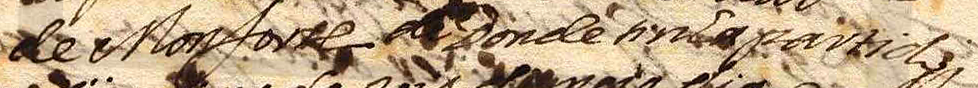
de Monforte de Donde tinha partido
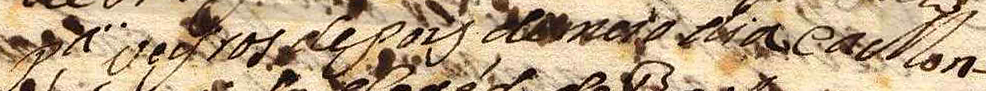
pa veyros depois de meio dia e a Mon
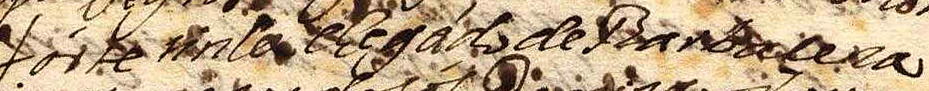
forte tinha chegádo de Barbacena
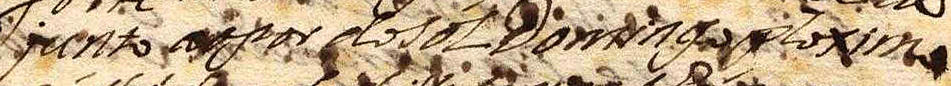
junto ao por do sol Domingo proximo
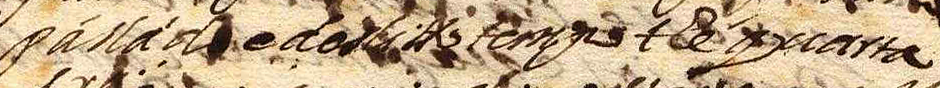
passado e do ditto tempo thé quarta
